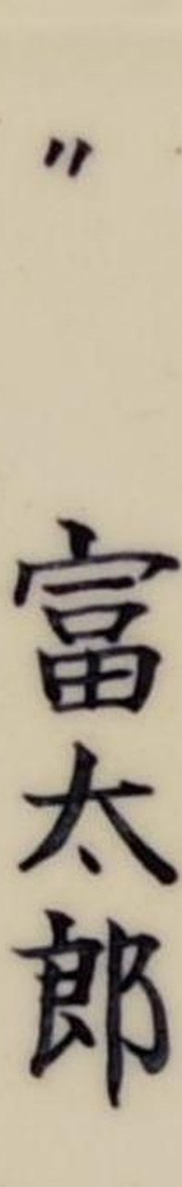富太郎
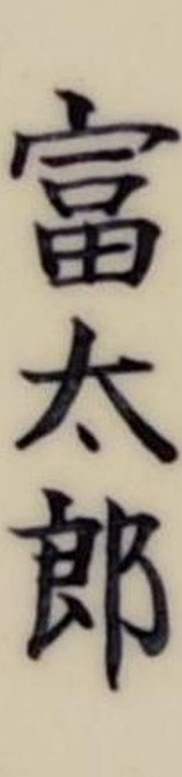富太郎
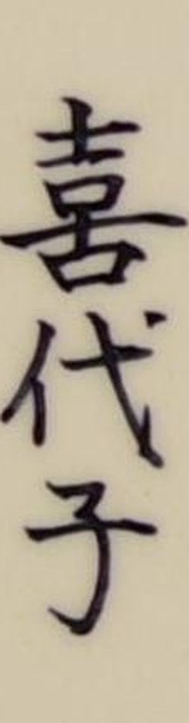喜代子
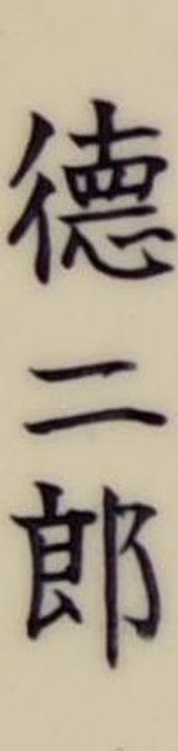徳二郎
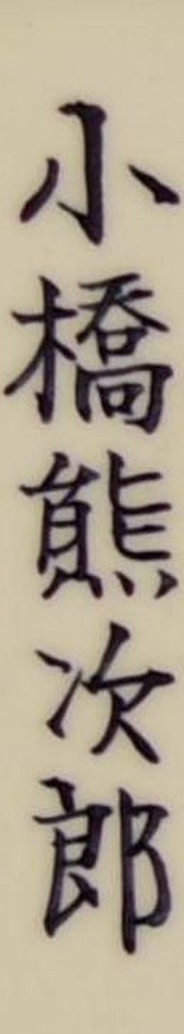小橋熊次郎
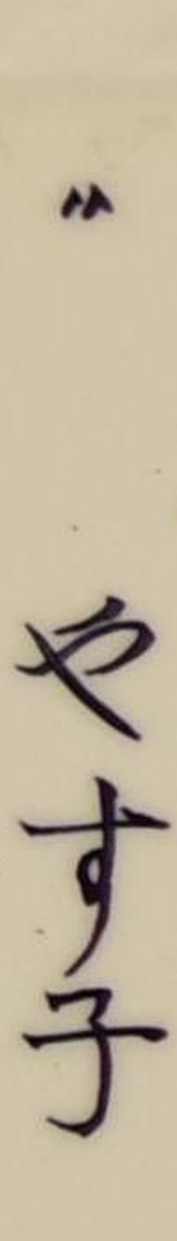やす子
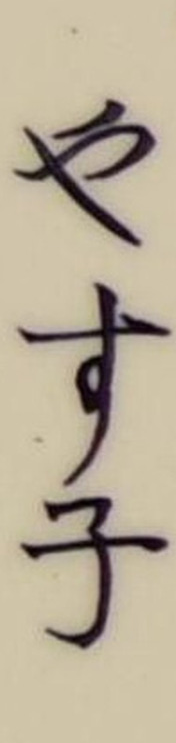やす子
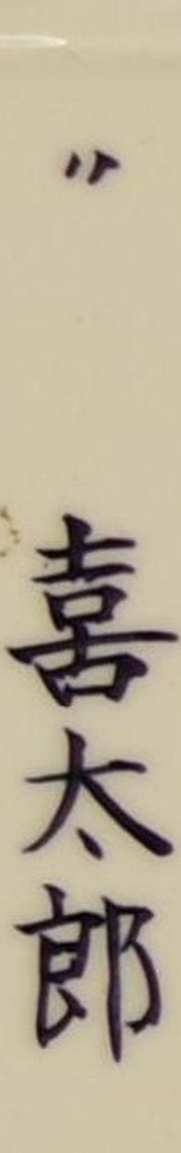喜太郎
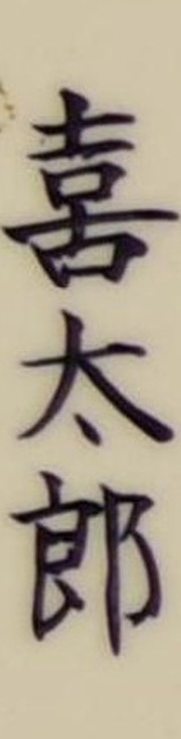喜太郎
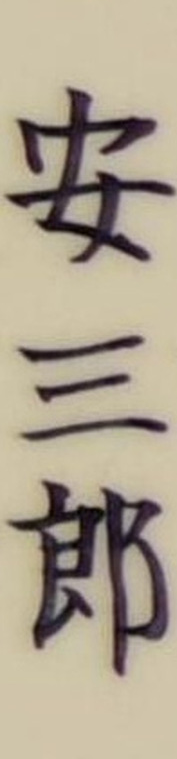安三郎
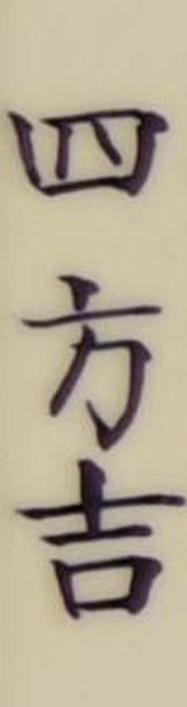四方吉

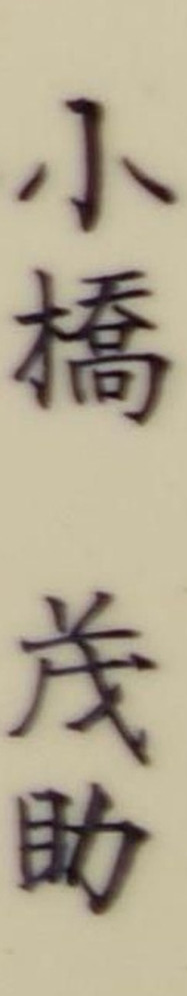小橋茂助
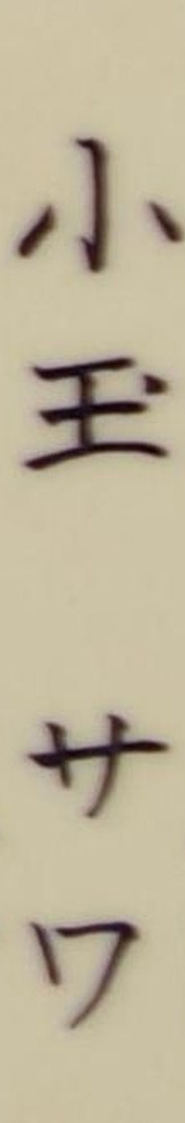小玉サワ
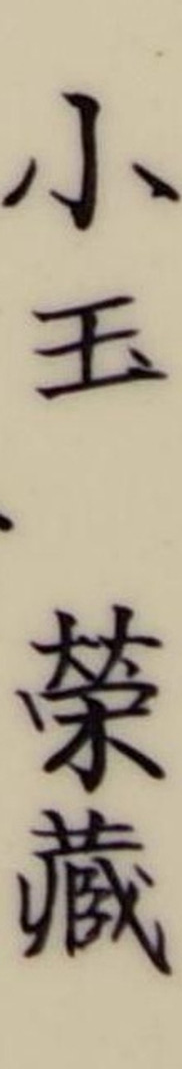小玉栄蔵
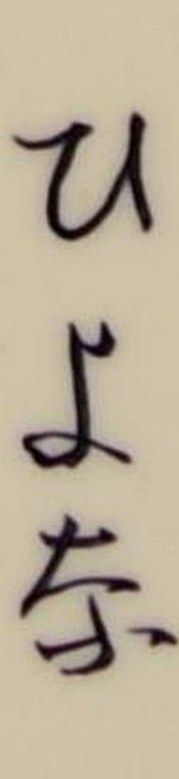ひよな
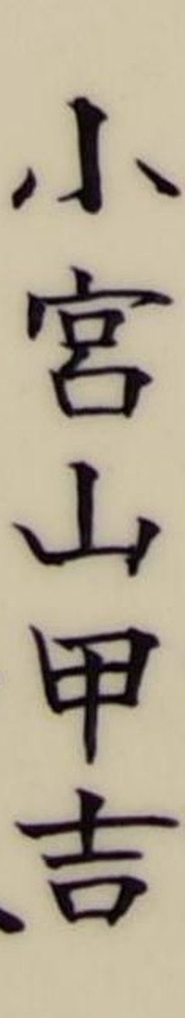小宮山甲吉
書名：E~L
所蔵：高野山金剛峯寺
